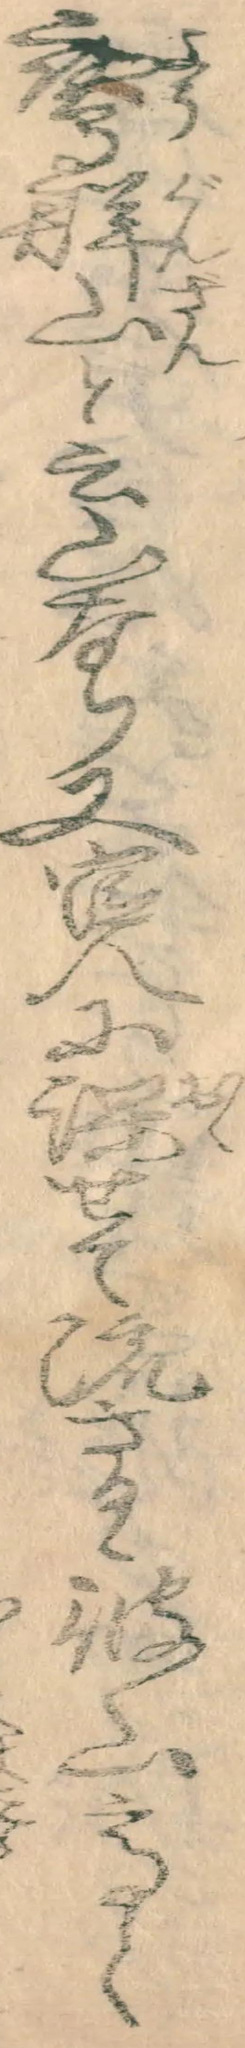鷹群山と云山なり又官人に課せて流さるゝ彼山高く
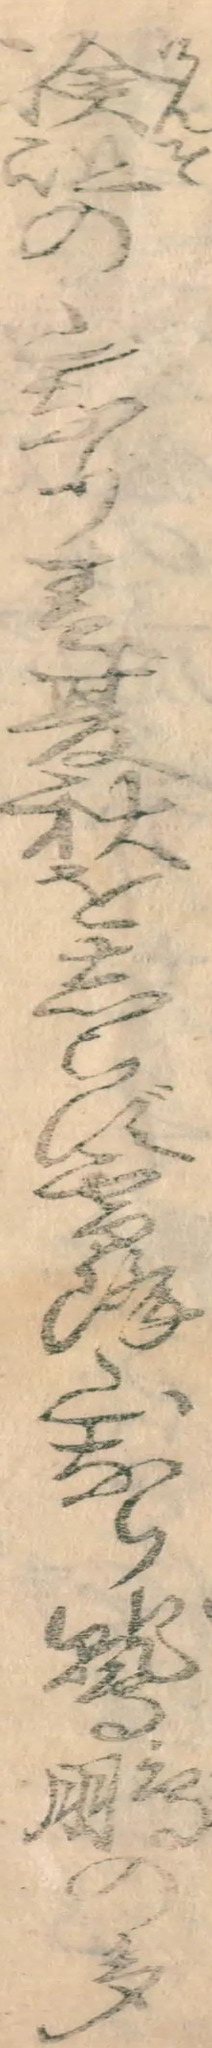険阻の山なり春夏秋をしらず雪降山なり鷲鵬の多
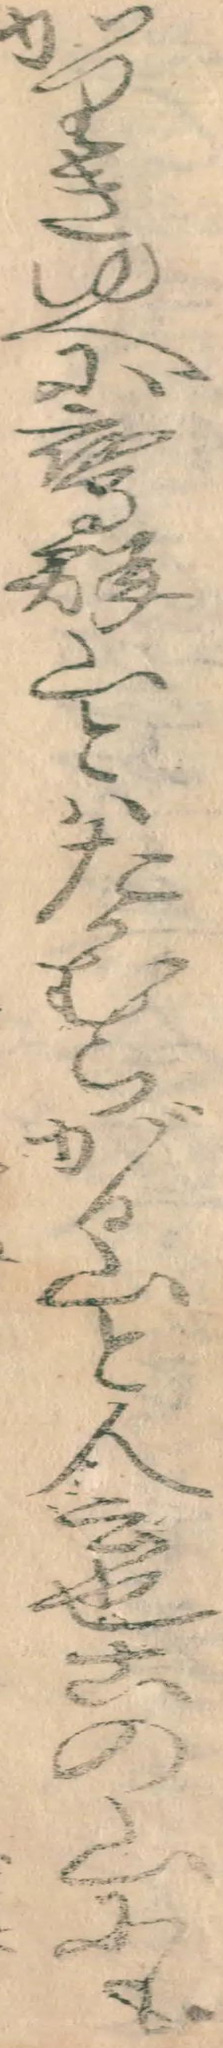かりきゆへに鷹群山とはたかむらがる山と人云也この山にも
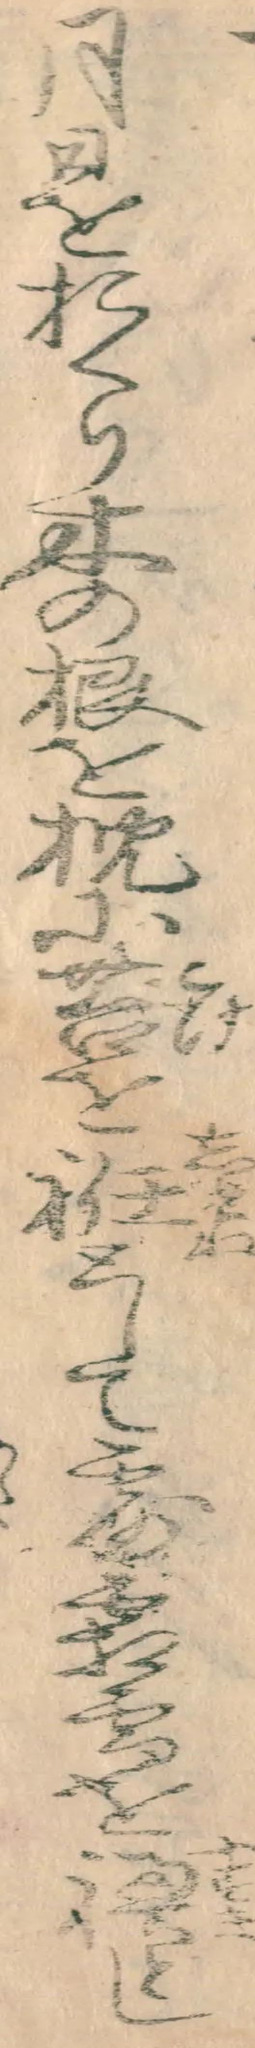月日をおくり木の根を枕に苔を袵として露霜雪を襖とし
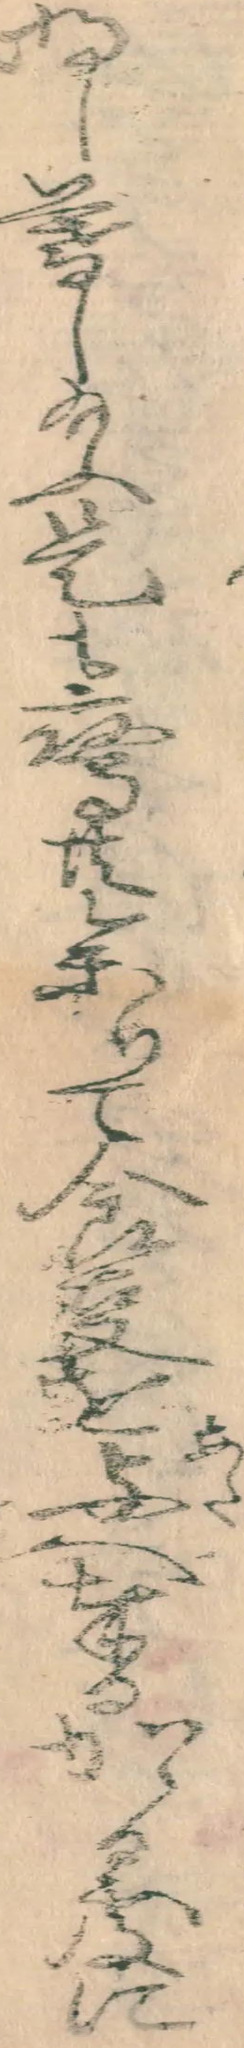明し暮し給ふ是も鷹共参りて食事を与へ奉るかゝる処に
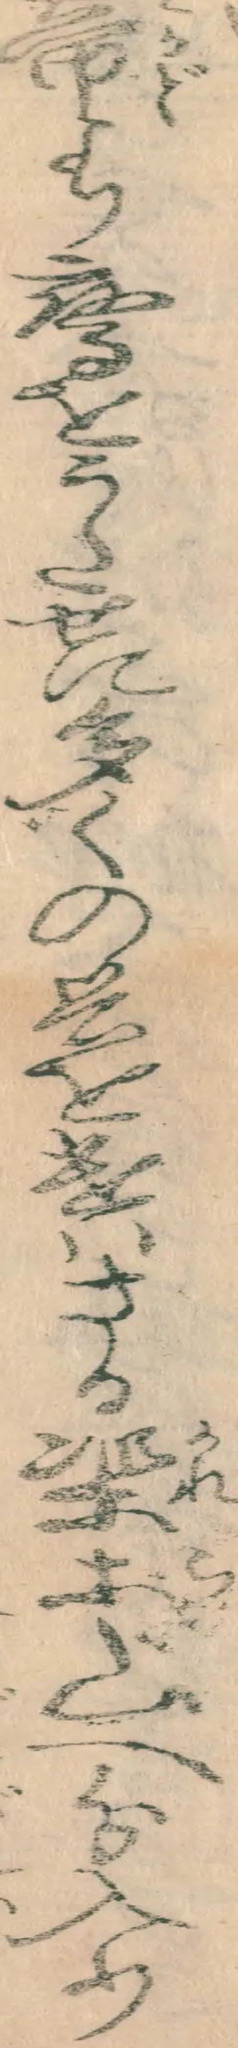帝より鷹をうたせに多くの兵を遣はさる渠等山へ分入り
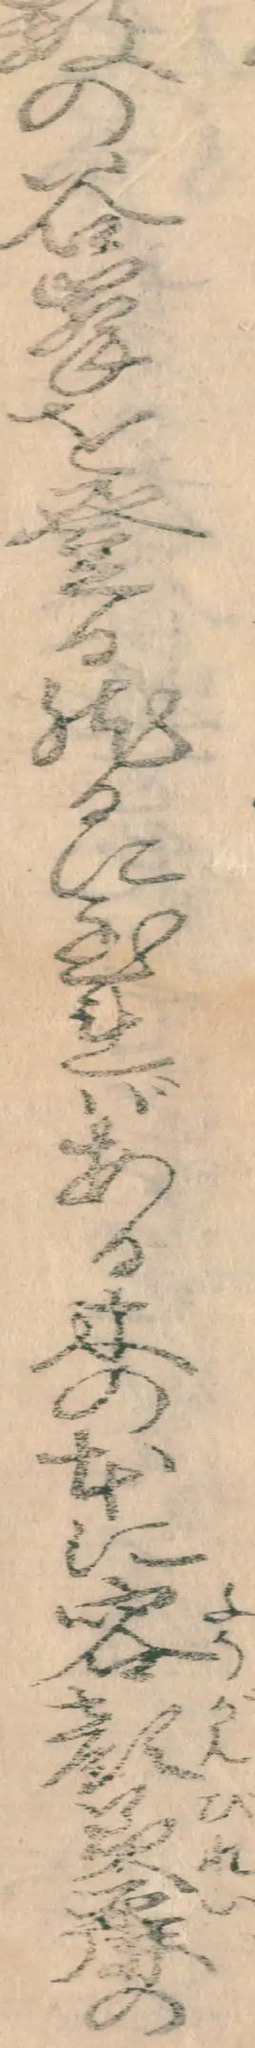数の谷峯を登る然るに至ればある木の本に容顔美麗の
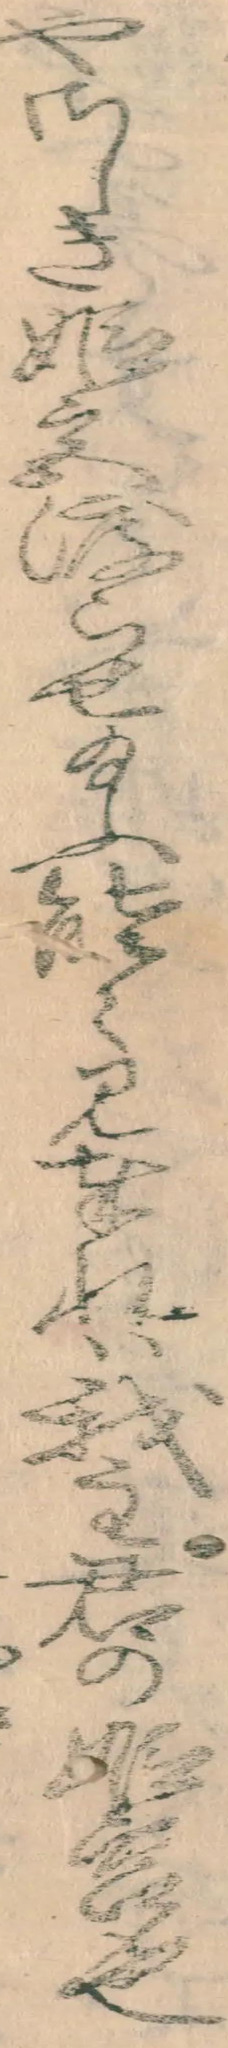やさしき姫宮渡らせ給ふ能々見奉れは我主君の姫宮也
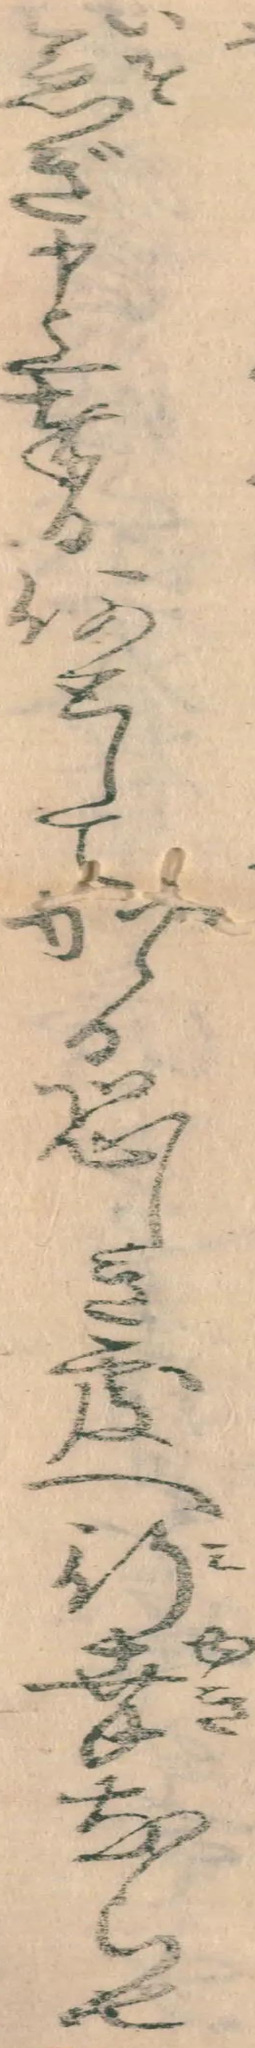急ぎ申上奉る何としてかゝる恐しき処へ行幸ならせ
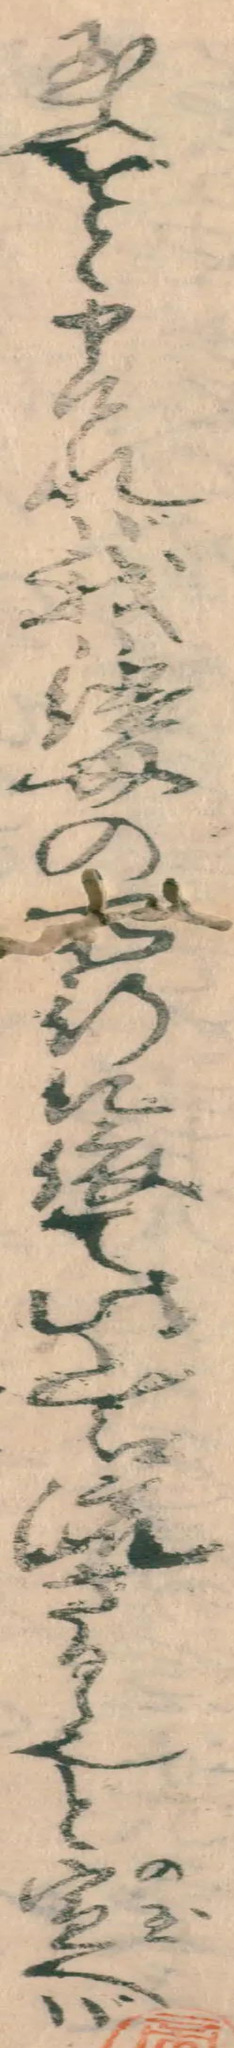玉ふぞと申ければ我は継母の行に依て此山え流さるゝ也と宣へば
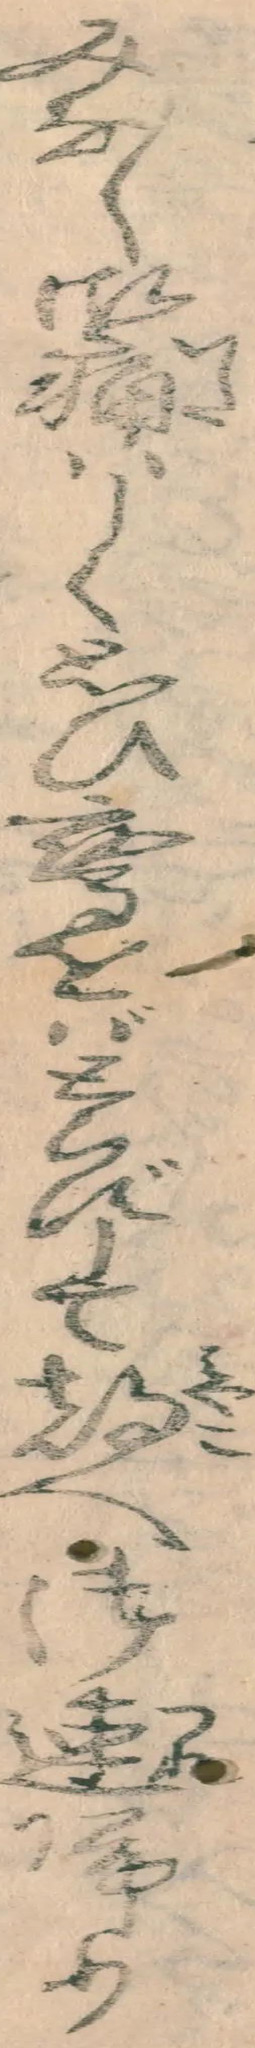みな〳〵御痛はしく思ひ鷹をばとらずして都へ御連帰り
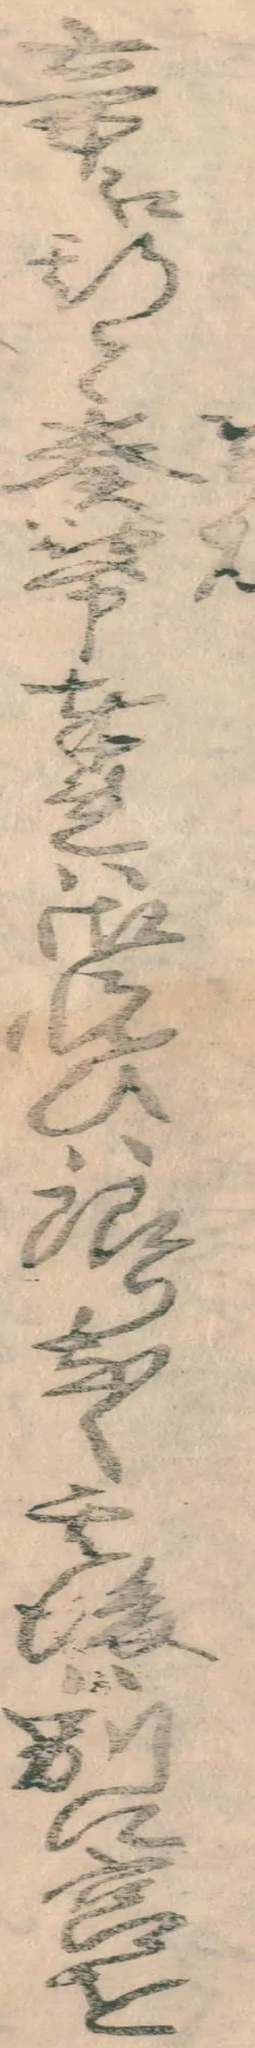帝え斯と奏聞申奉れは御悦ひは限りなく其後は別に宮を
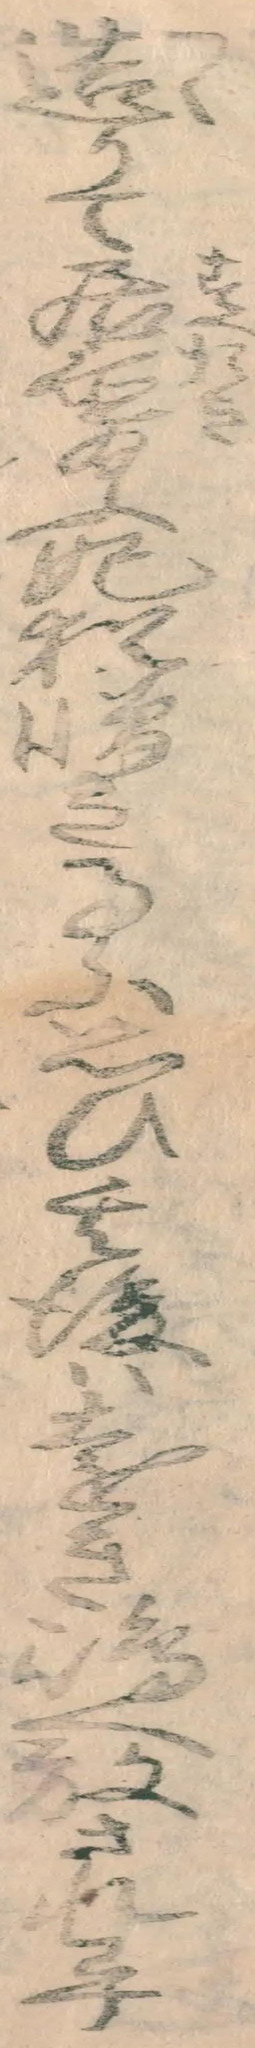造りて居置給ふ妃猶憎き事に思ひ其後は遠き島へ放され畢
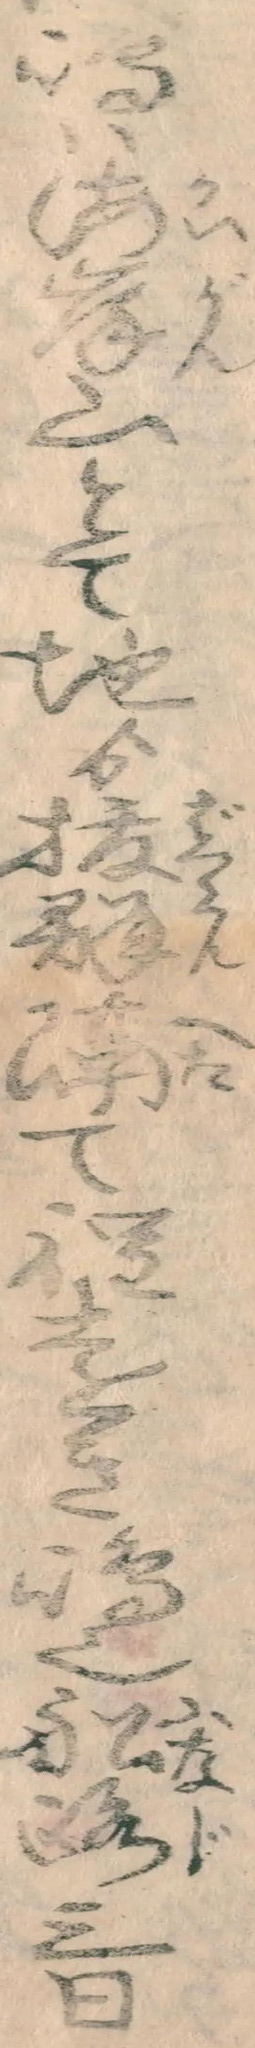島は海岸山とて地ゟ抜群隔て程遠き島也船路三日
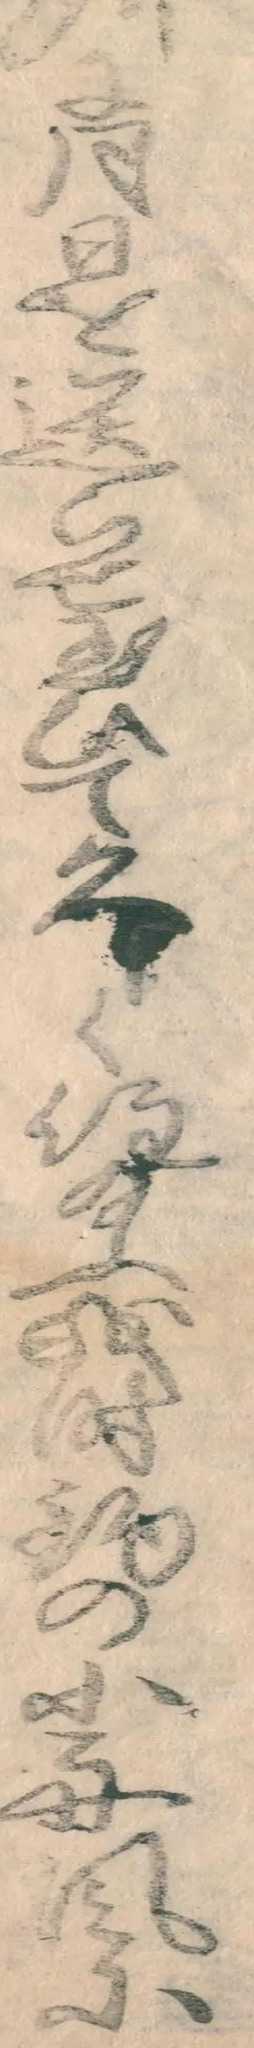所に月日を送らせ玉ひて久しく住給ふ或時釣の小舟風に
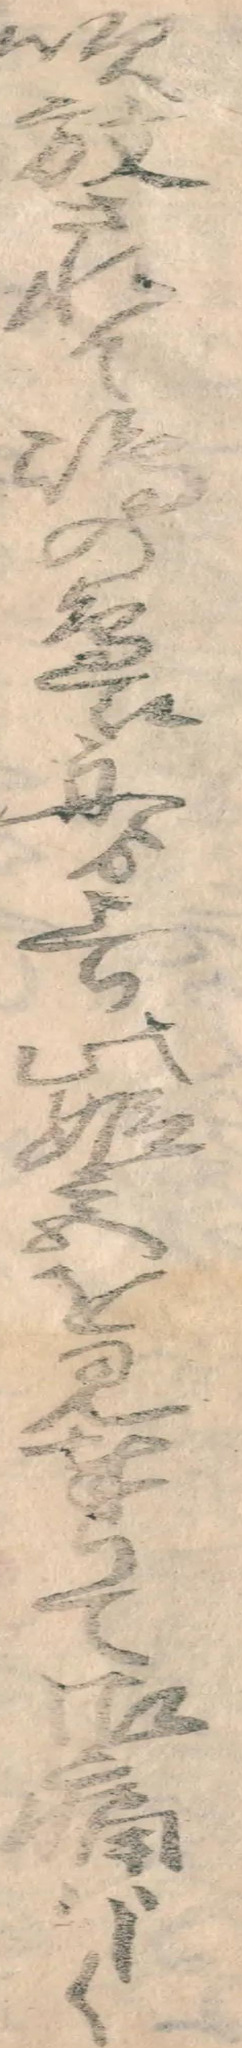吹放されて島の辺え舟ゟ上り此姫宮を見奉りて御痛はしく
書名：蚕養御由来記
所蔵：国立国会図書館 National Diet Library, JAPAN
